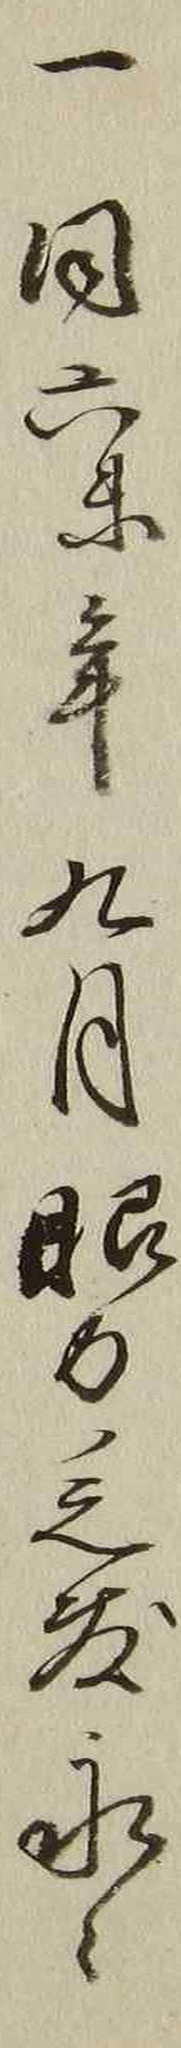一同六未年九月眼力乏敷永々
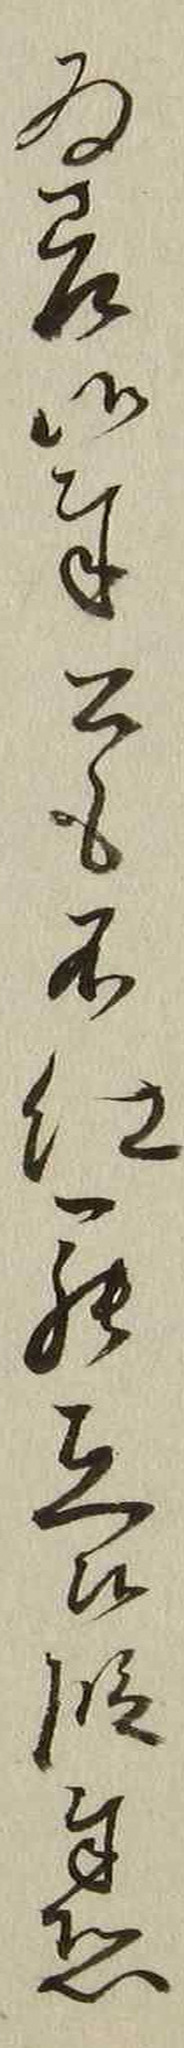為差御奉公も不仕罷在候段奉恐
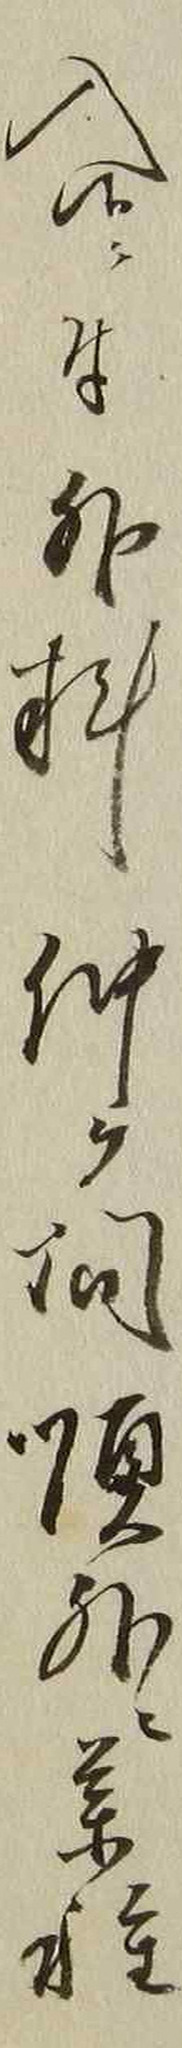入候ニ付外料仲ヶ問順外ニ薬種
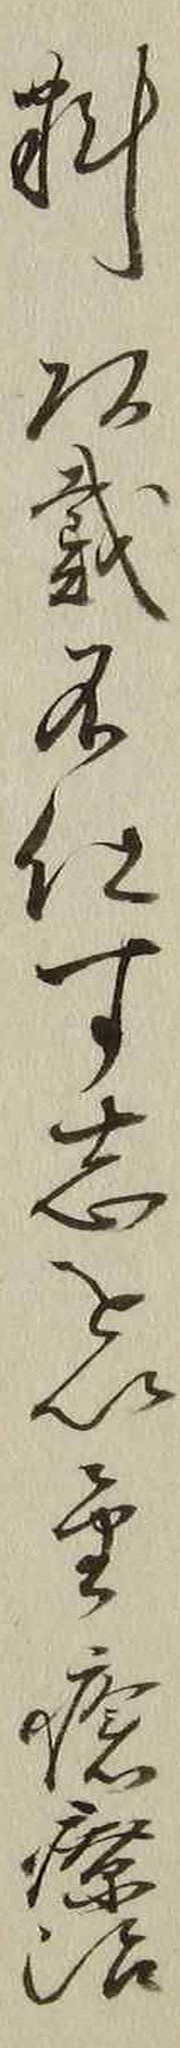料頂戴不仕寸志を以重瘡療治
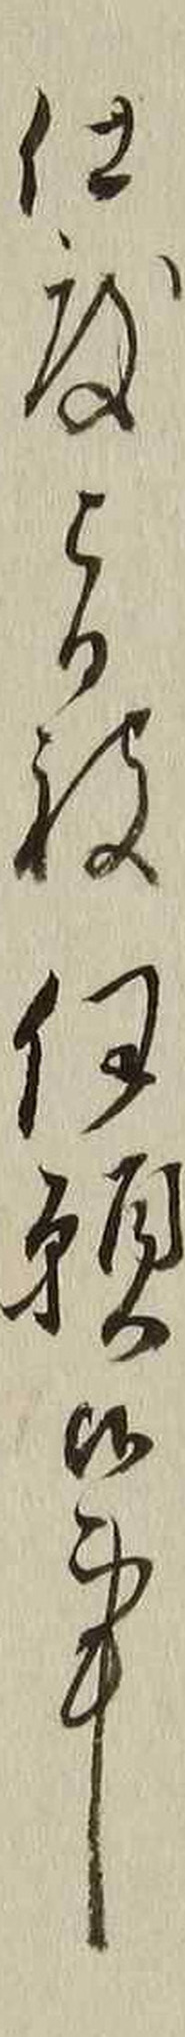仕度旨被任願候事
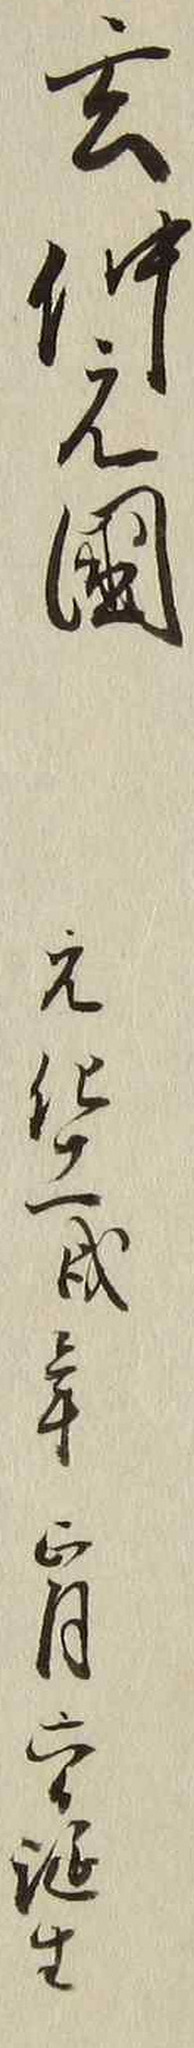玄仲元国文化十一戌年正月六日誕生
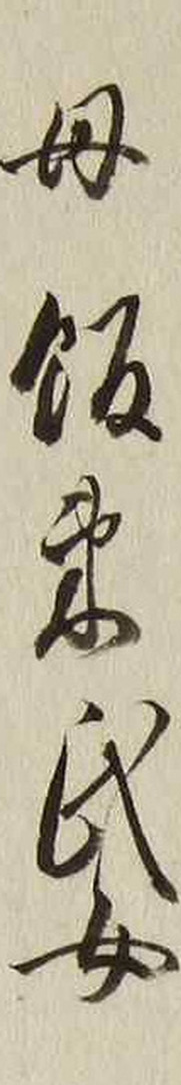母飯束氏女
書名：諸士系譜　巻之129　た之部5
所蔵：会津若松市立会津図書館
